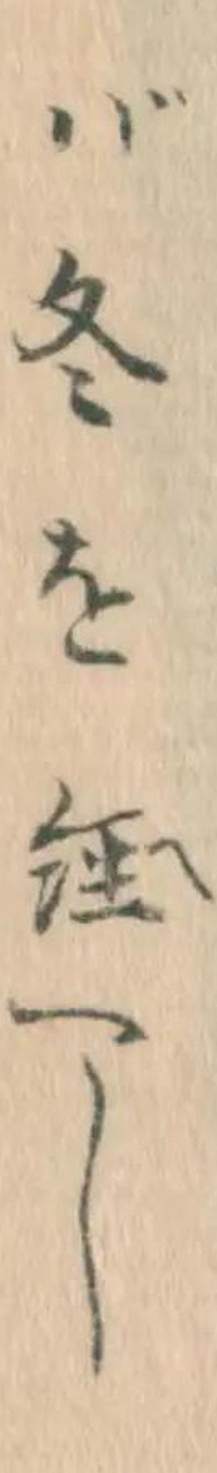ば冬を経へし

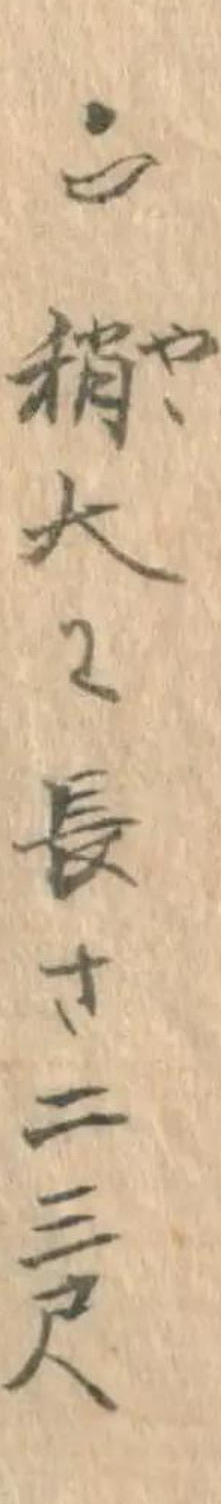●○稍大に長さ二三尺
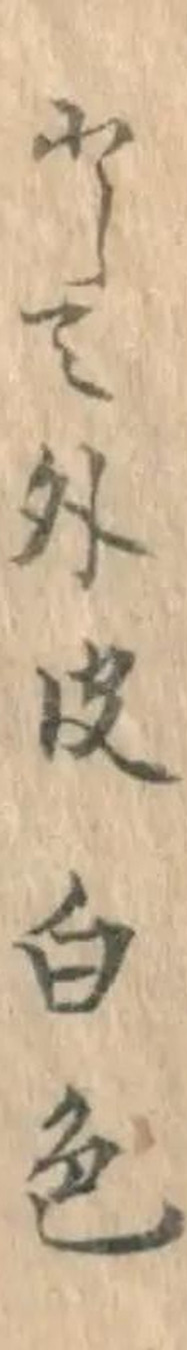にして外皮白色
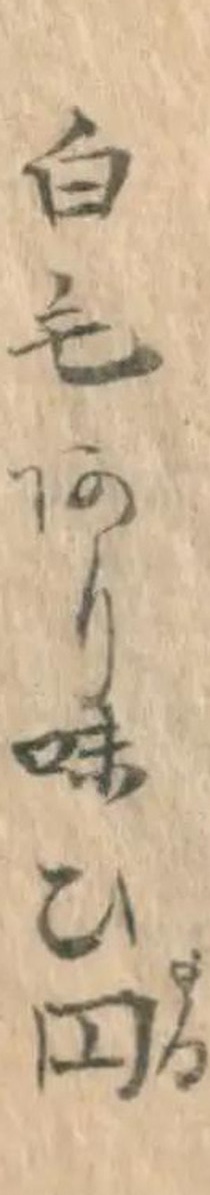白毛あり味ひ円
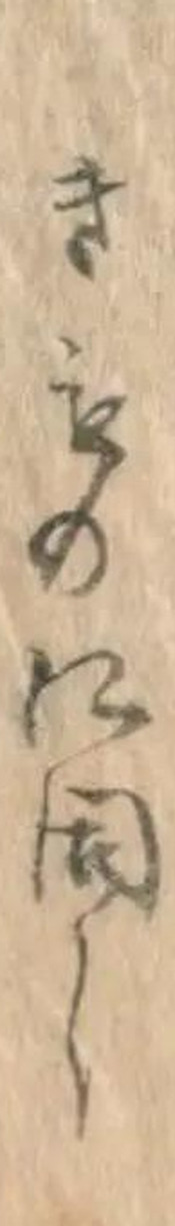きものに同し
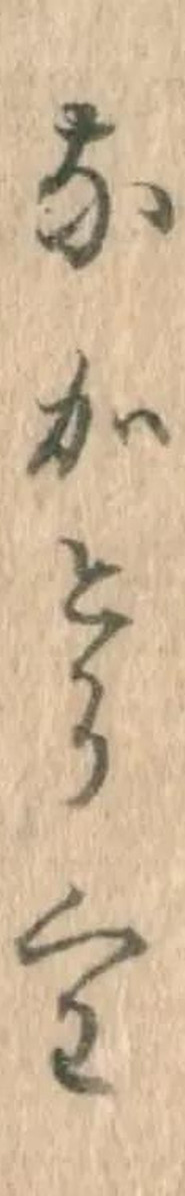なかとうくわ
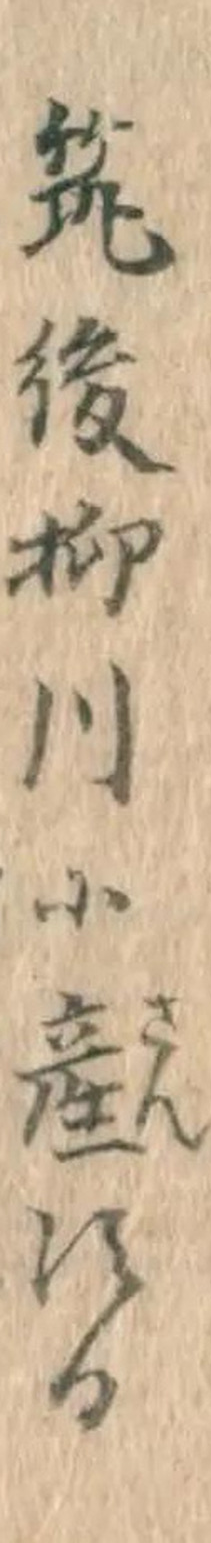筑後柳川に産する
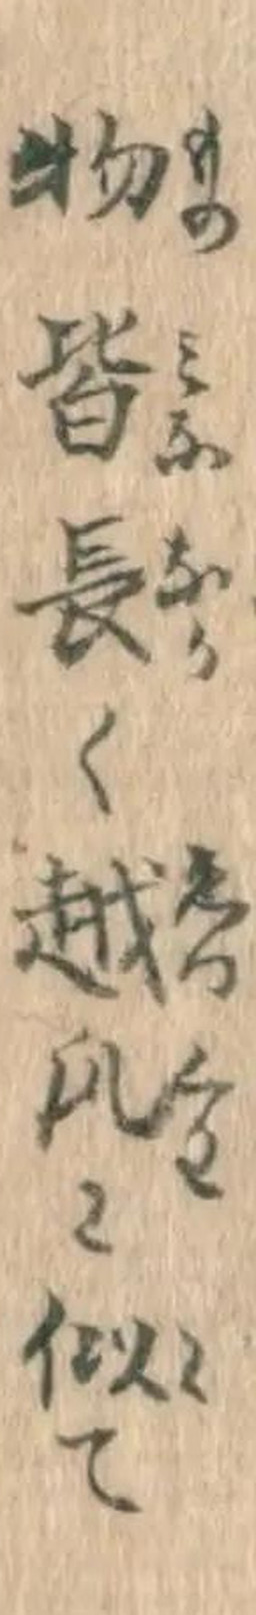物皆長く越瓜に似て

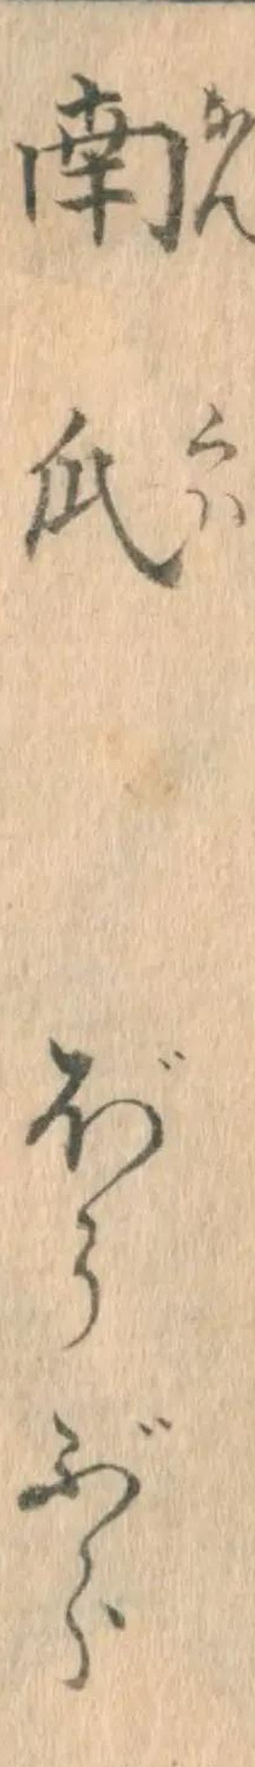南瓜ぼうぶら
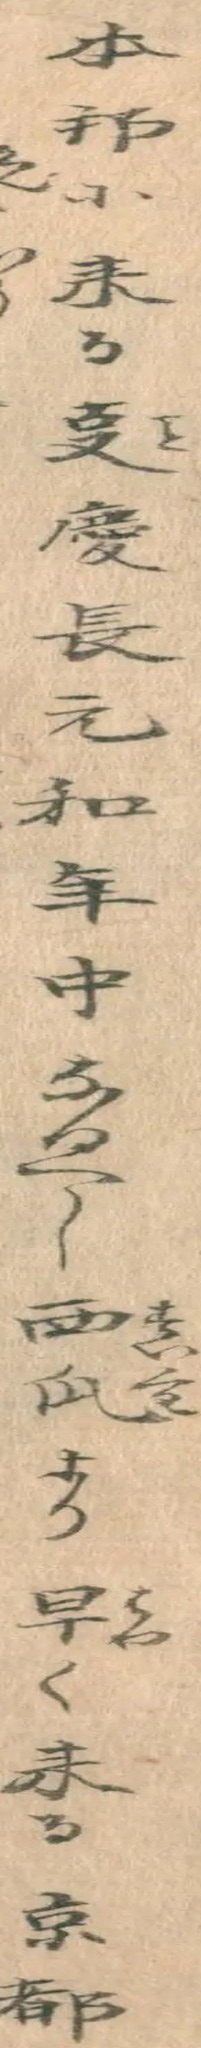本邦に来る事慶長元和年中なるへし西瓜より早く来る京都
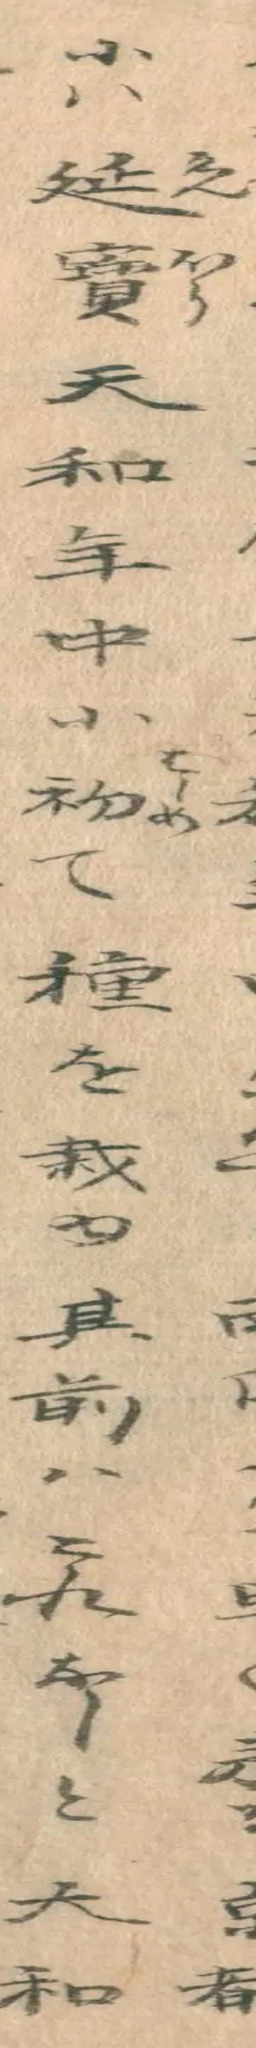には延宝天和年中に初て種を栽ゆ其前はこれなしと大和
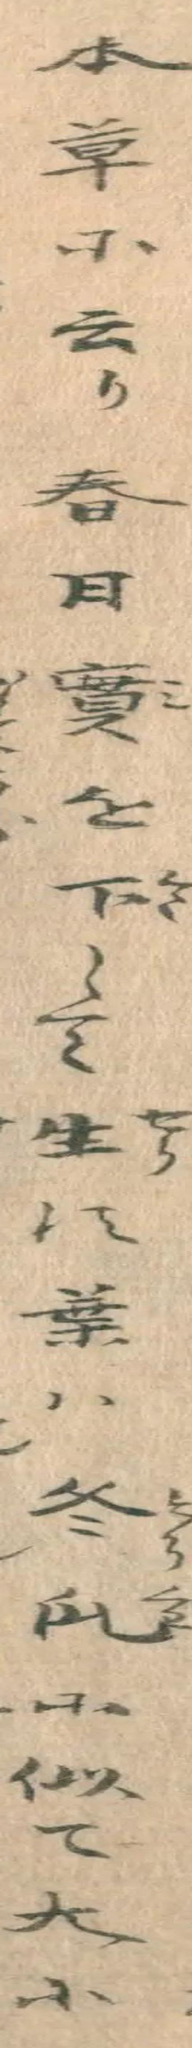本草に云り春月実を下して生す葉は冬瓜に似て大に
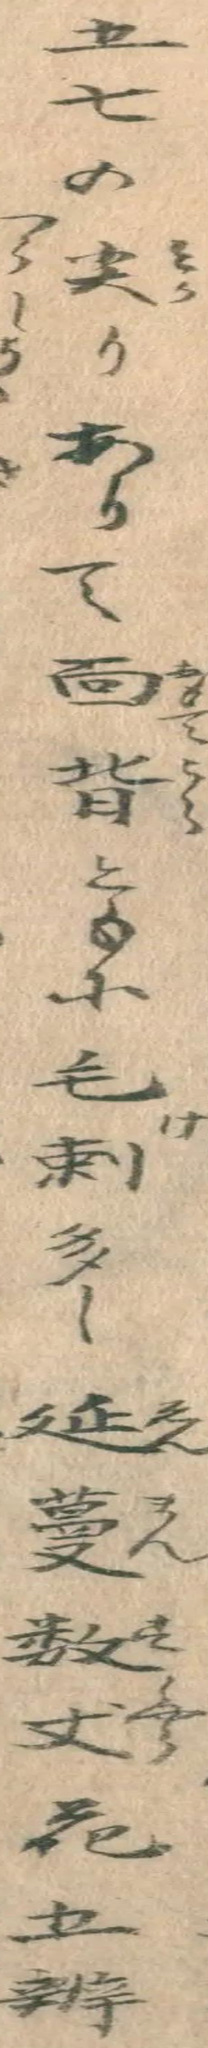五七の尖りありて面背ともに毛剌多し延蔓数丈花五弁
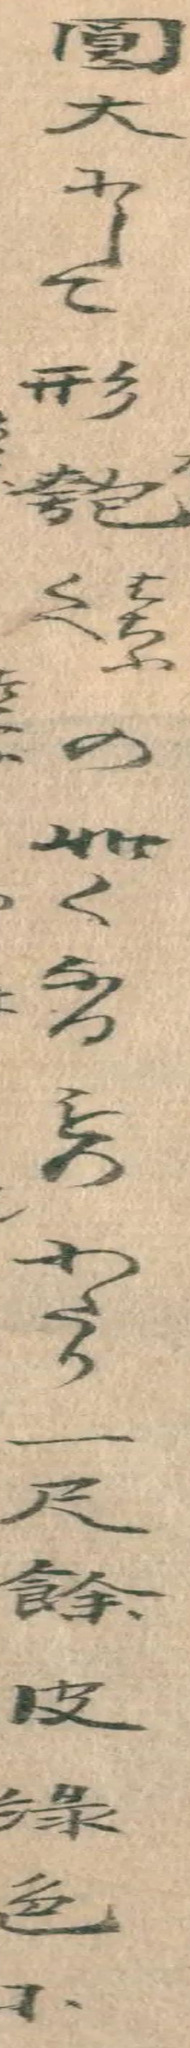円大にして形匏はちふくへの如くなるものわたり一尺余皮緑色に
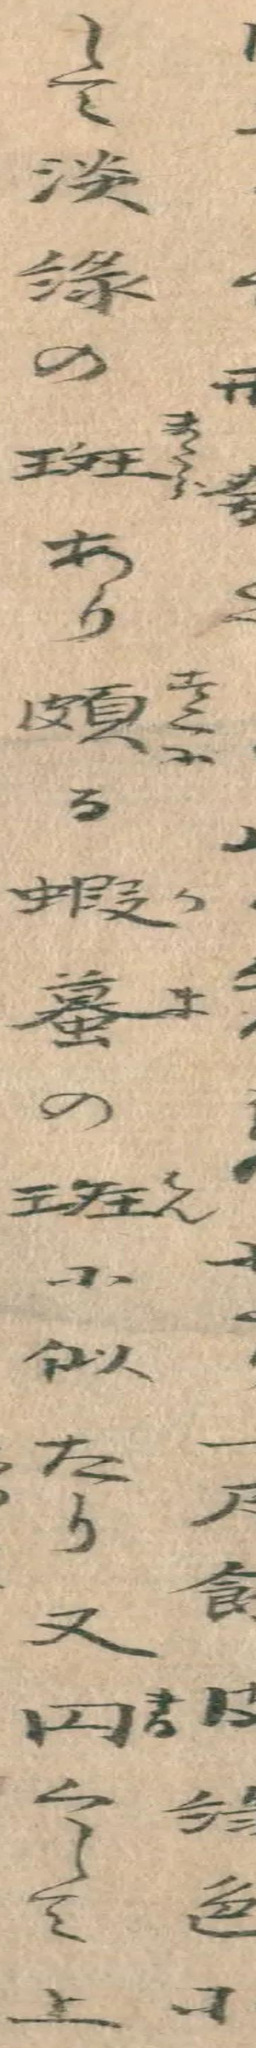して淡緑の斑あり頗る蝦蟇の斑に似たり又円くして上
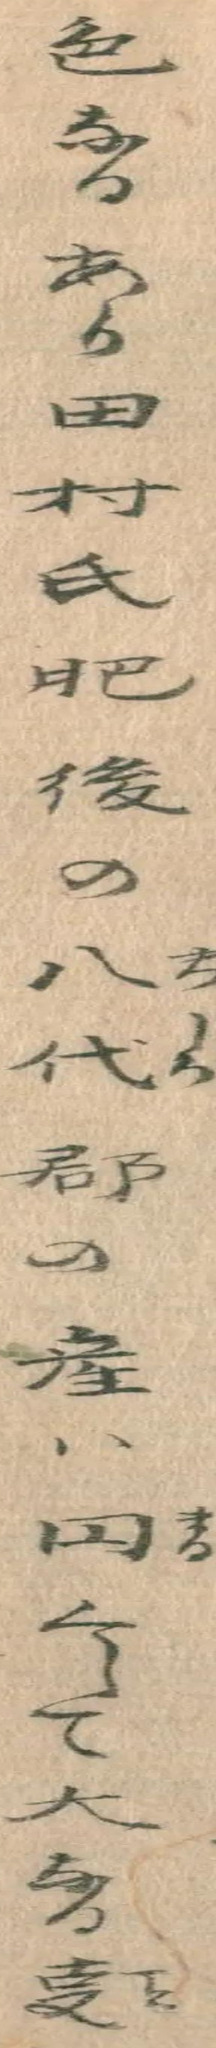色なるあり田村氏肥後の八代郡の産は円くして大なる事
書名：本草図譜. 巻52-54
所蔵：国立国会図書館 National Diet Library, JAPAN
